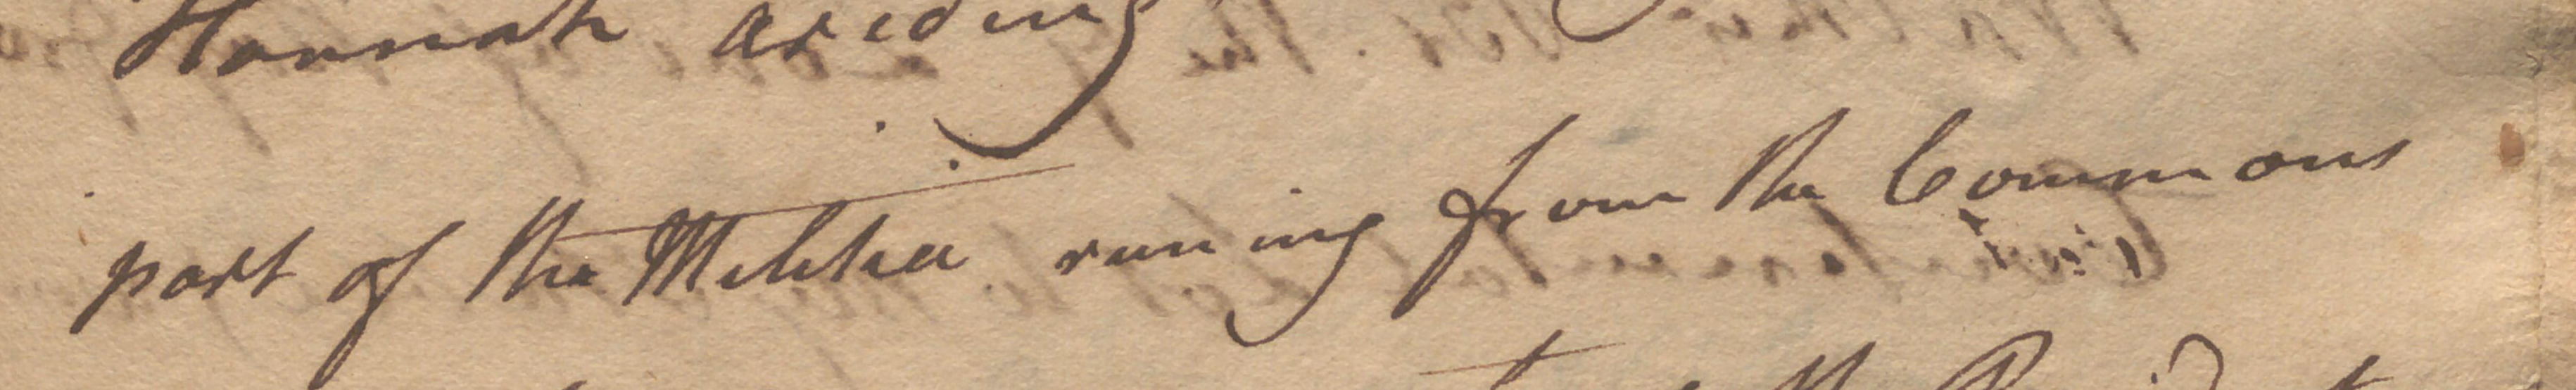part of the Militia runing fr one the Commons
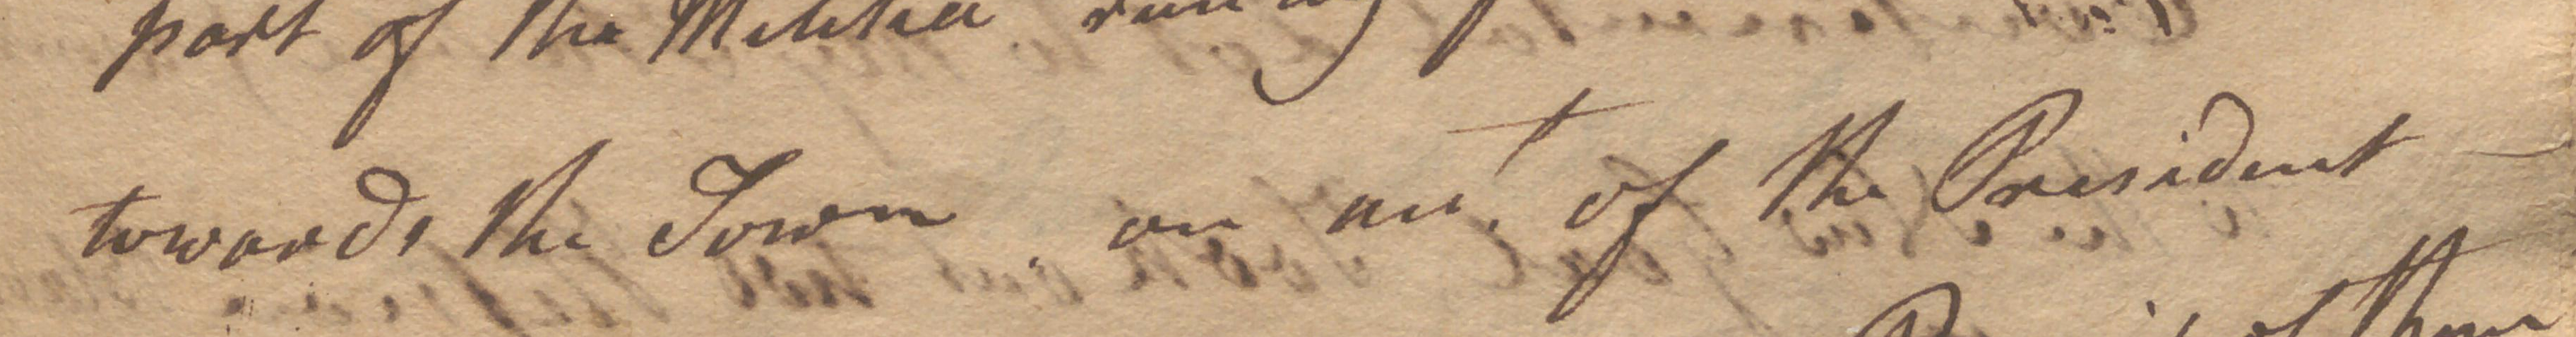towards the Town on acc^t. of the President
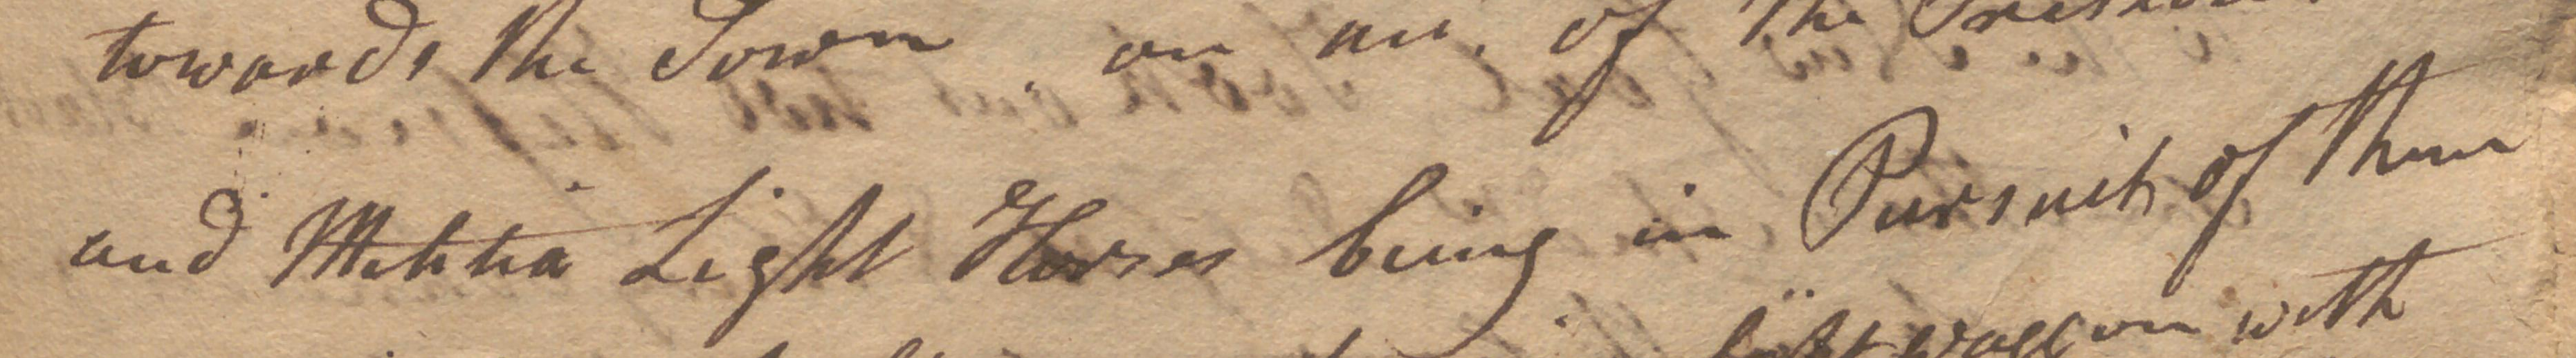and Militia Light Horses being in Pursuit of there
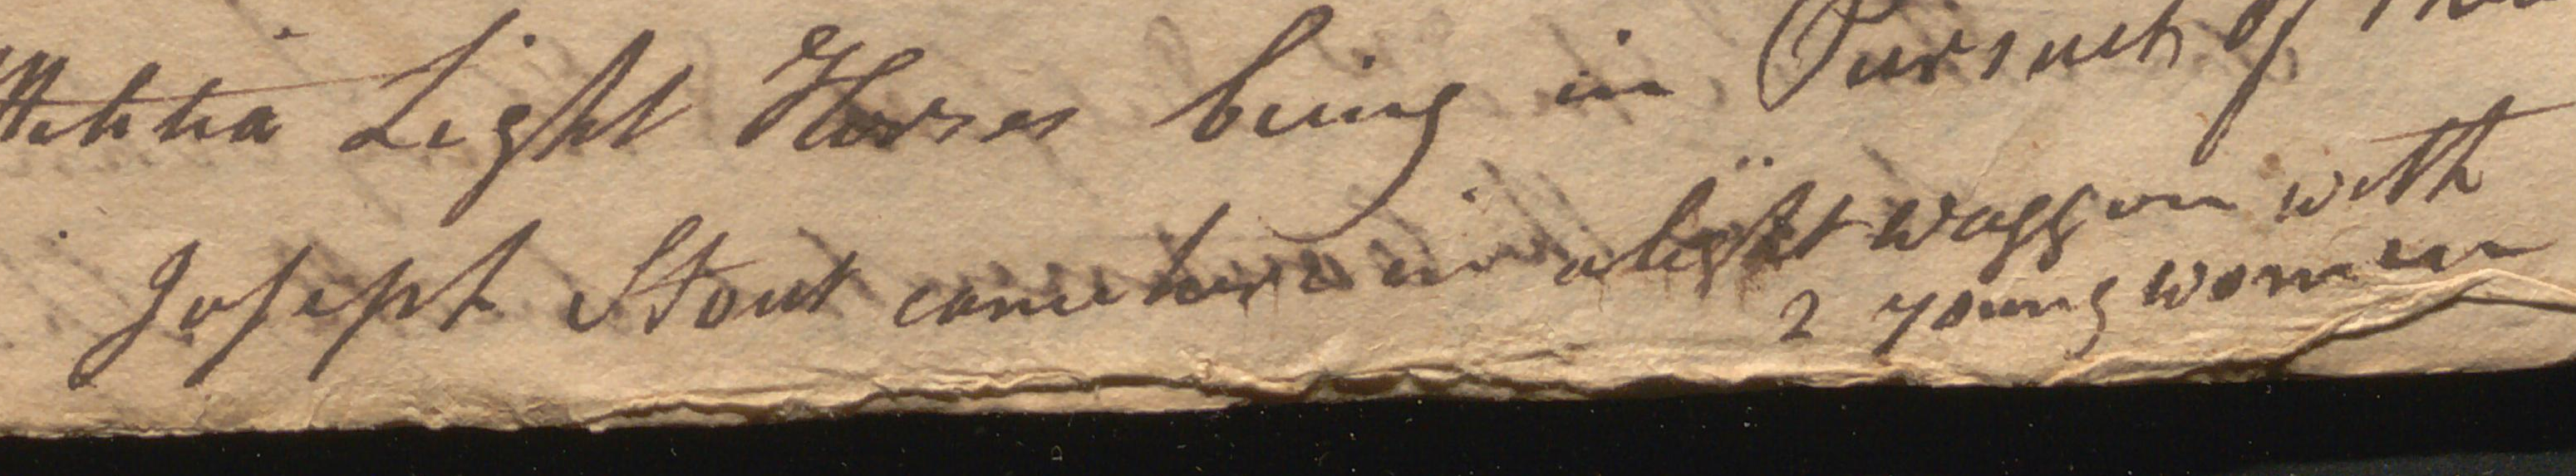Joseph Stout came home in a light waggon with
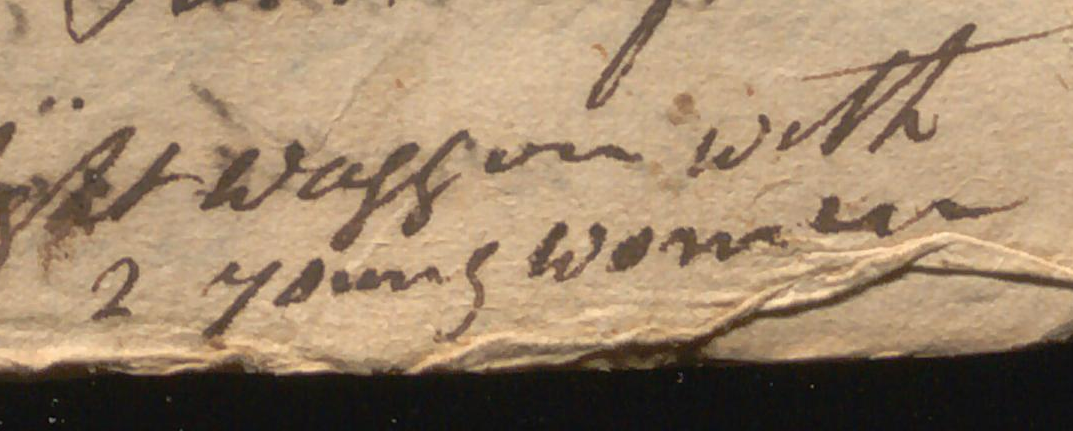2 young women
